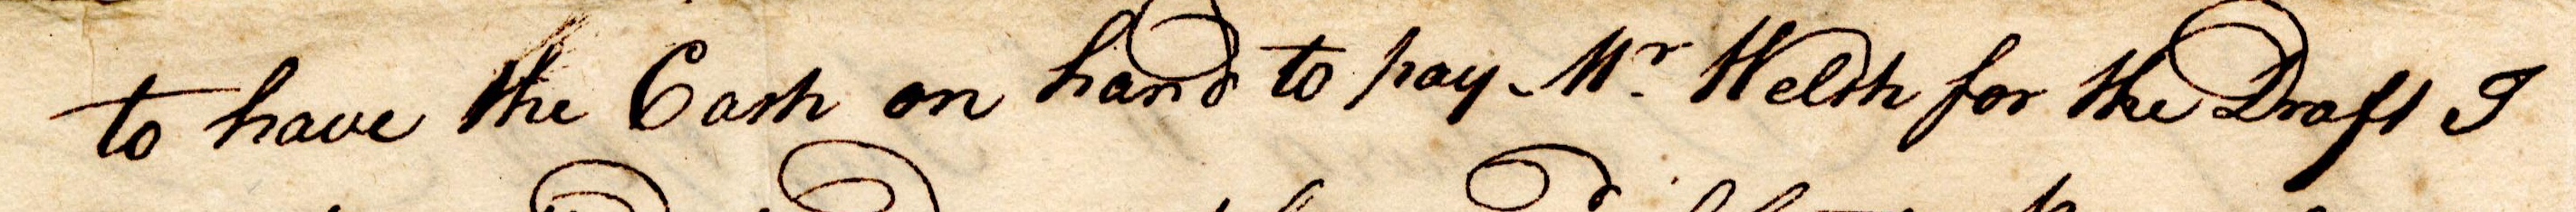To have the coin on hand to pay M^r. Welsh for the Draft I
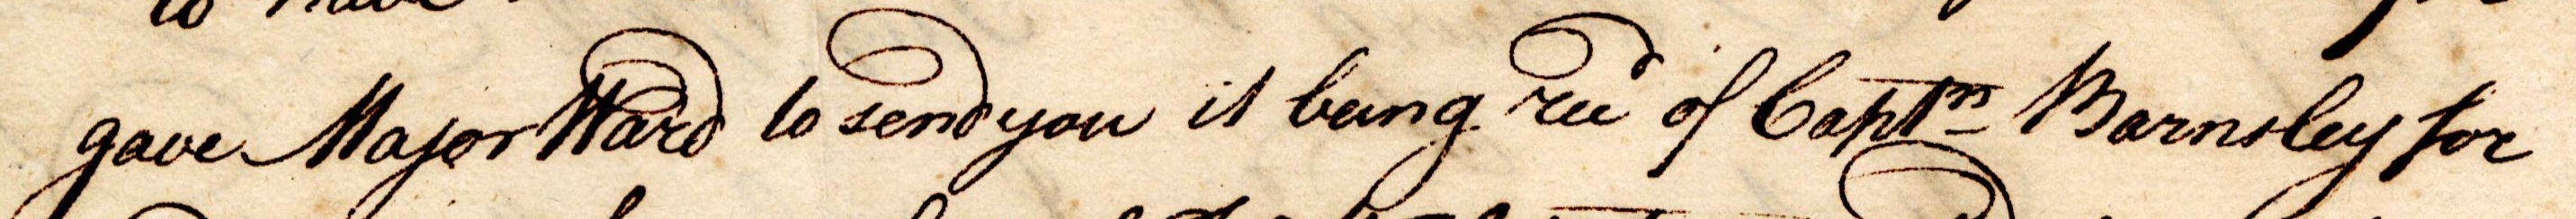gave Major Ward to send you it being rec^d of Capt^n Mannerley for
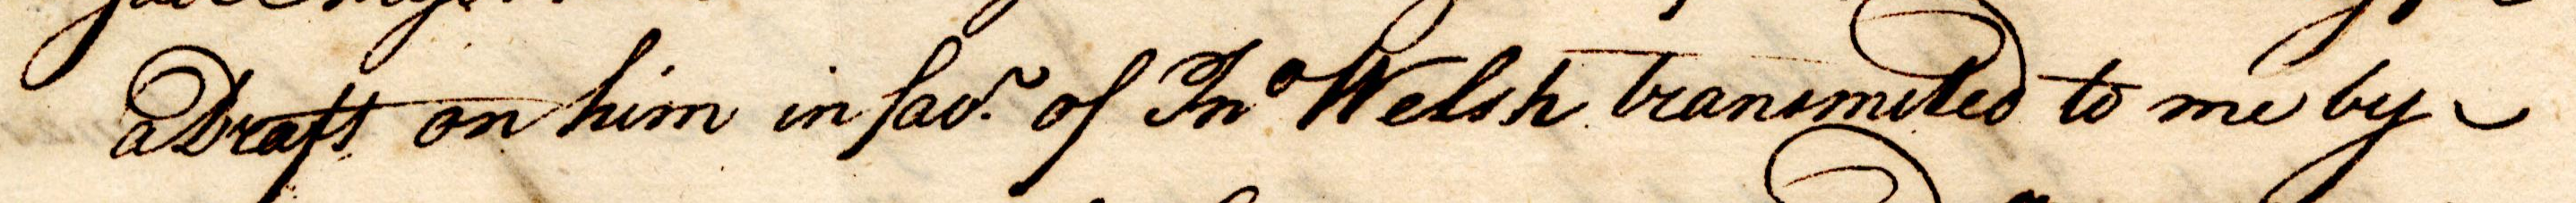Drafts on him in fav^r. of Jn^o Welsh transmited to me by
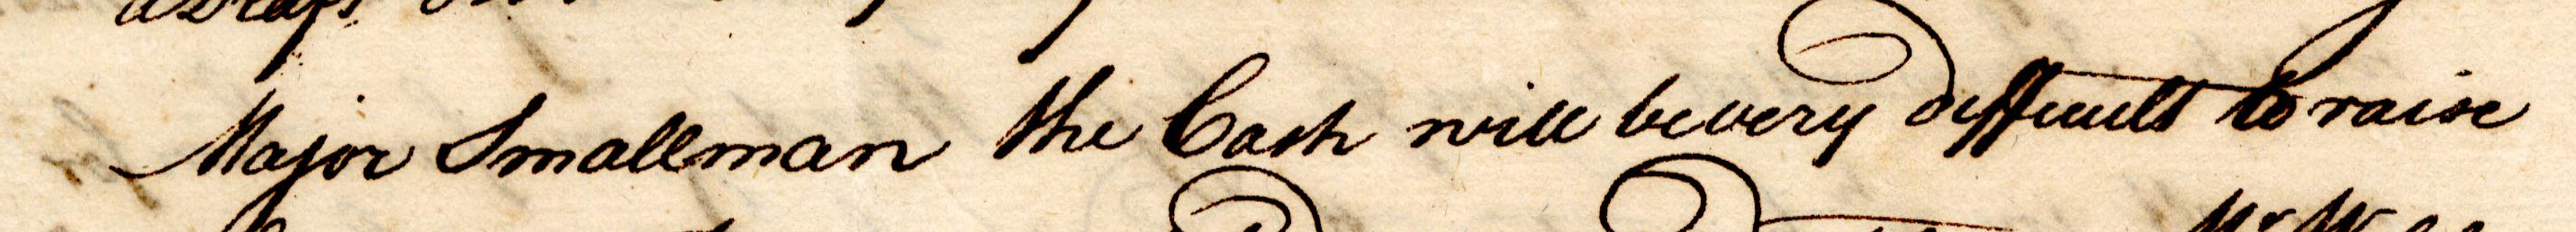Major Smallman the Cash will be very difficult to raise
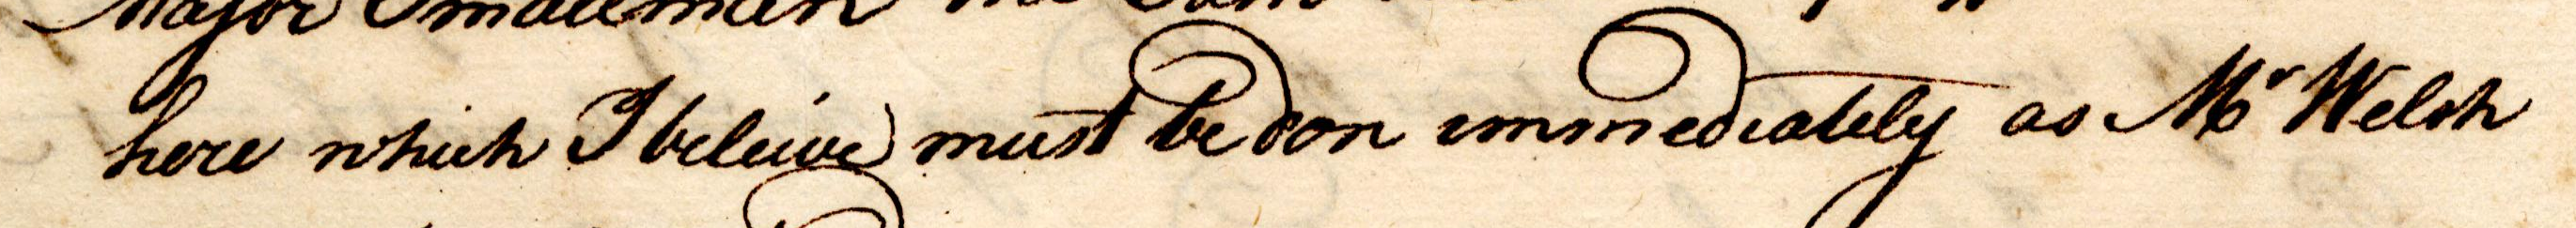here which I believe must be don immediately as M^r Welsh
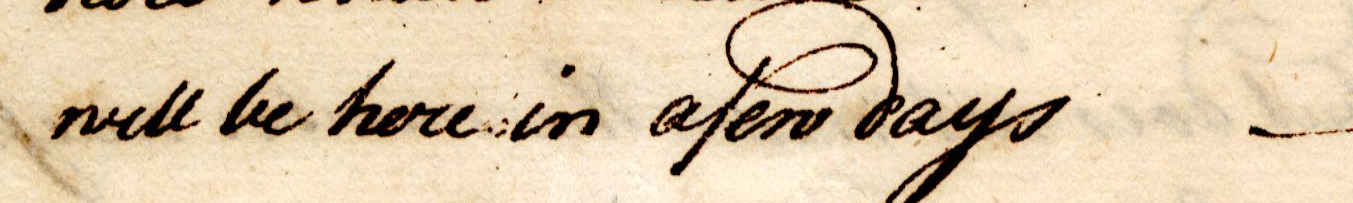will be here in a few days
